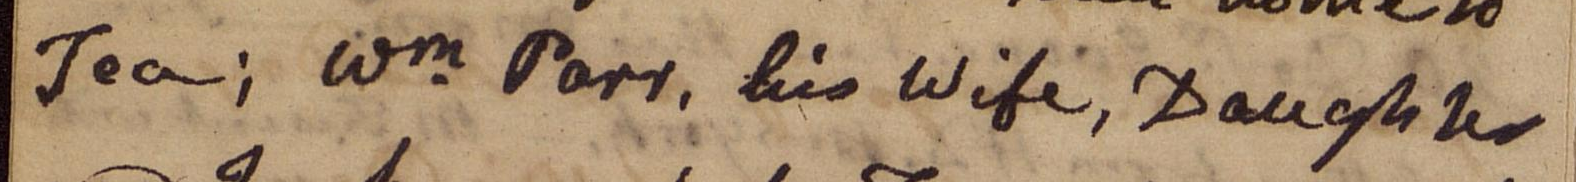Tea; W^m. Parr, his Wife, Daughter
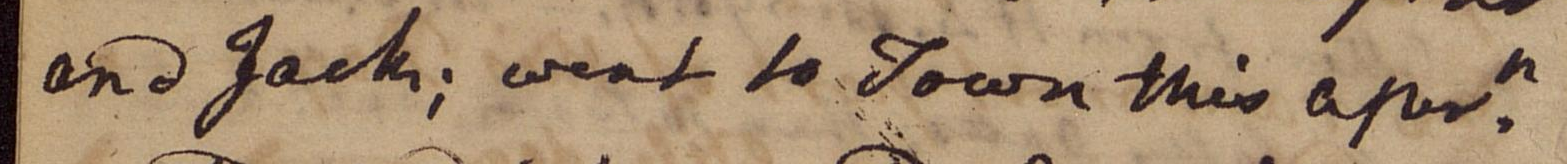and Jack; went to Town this after^n.
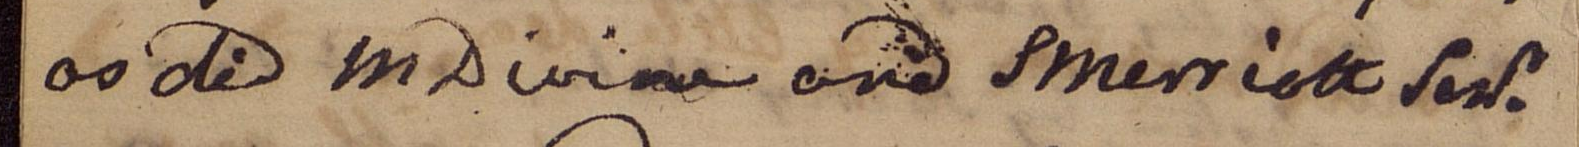as did M Divine and S Merriott Sen^r.
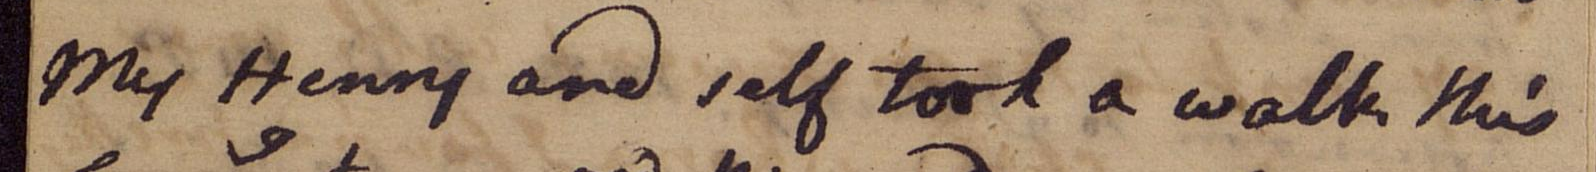My Henry and self took a walk this
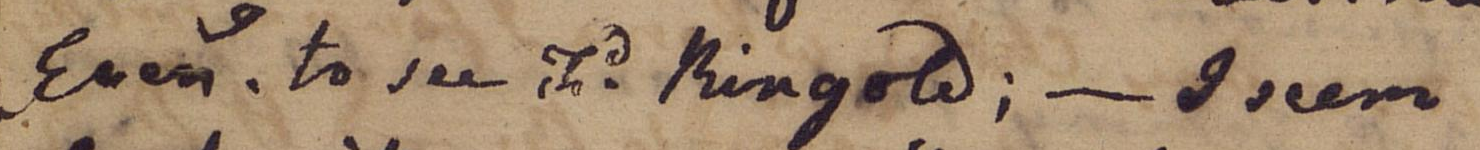Even^g. to see F^d. Ringold;- I seem
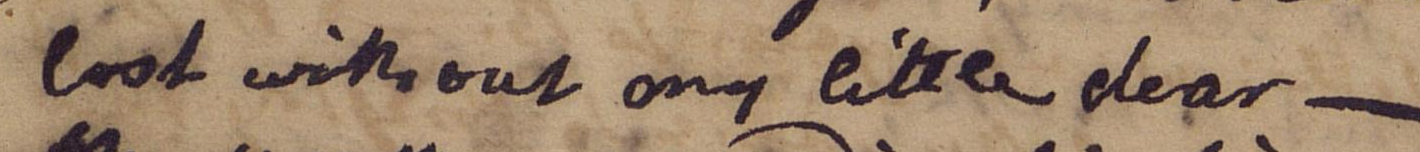lost without my little dear -
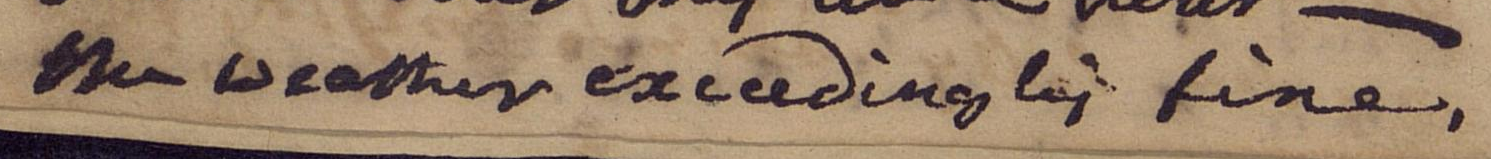the weather exceedingly fine.
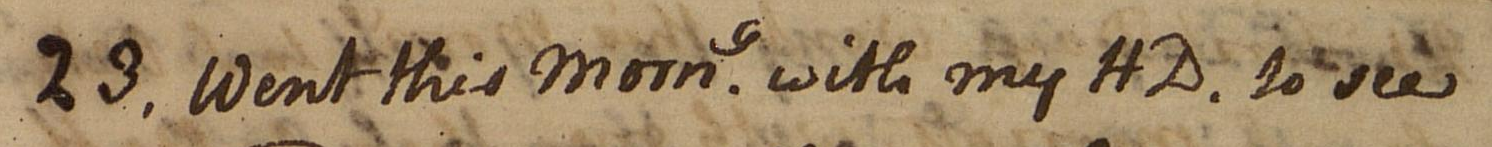23, went this morn^g. with my HD. to see
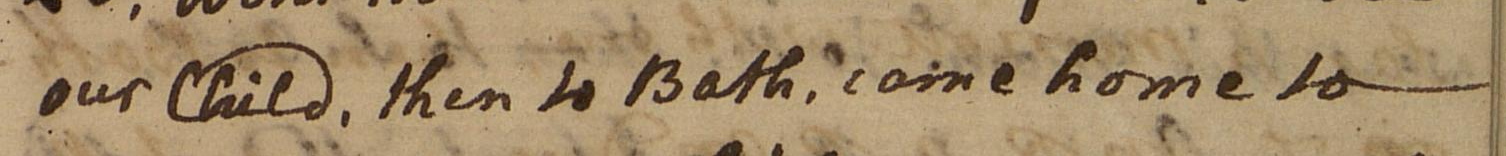our Child, then to Bath, came home to
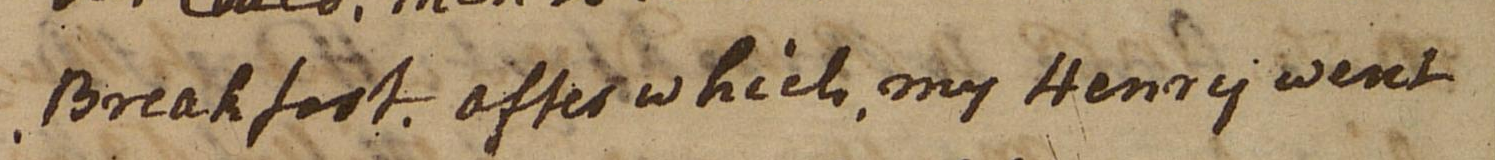Breakfast. after which, my Henry went
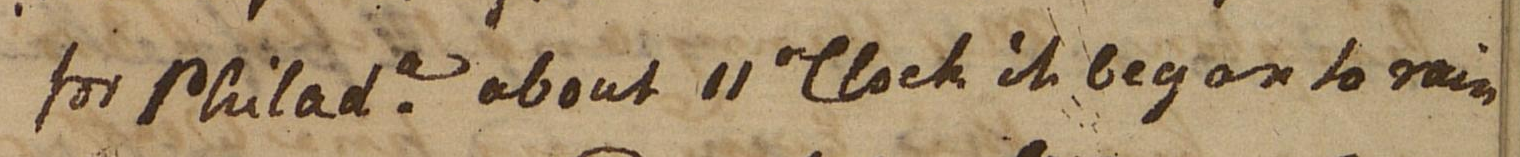for Philad^a. about 11 ^o Clock it began to rain
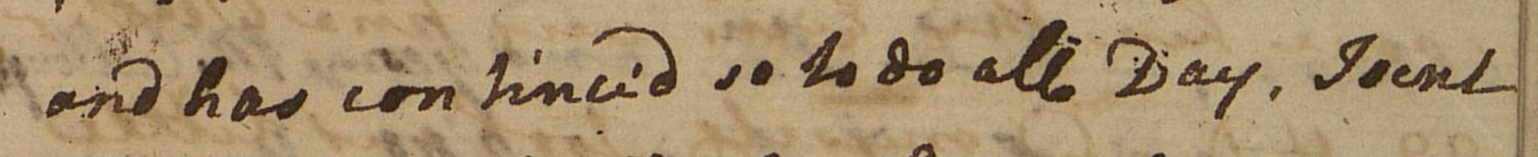and has continu'd so to do all Day, I sent
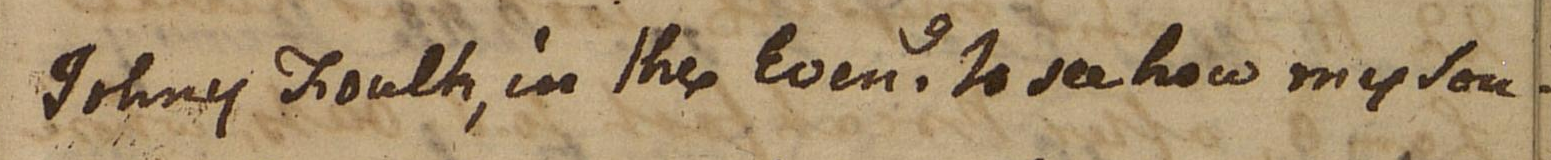Johny Foulk, in the Even^g. to see how my Son
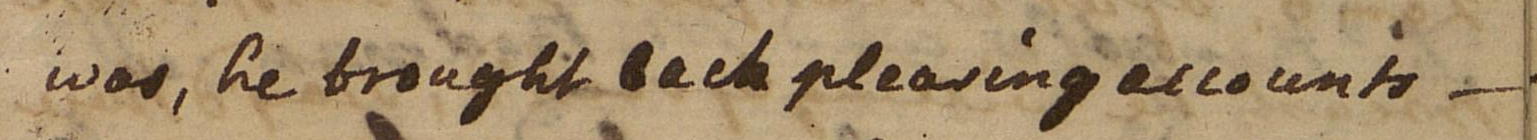was, he brought back pleasing accounts-
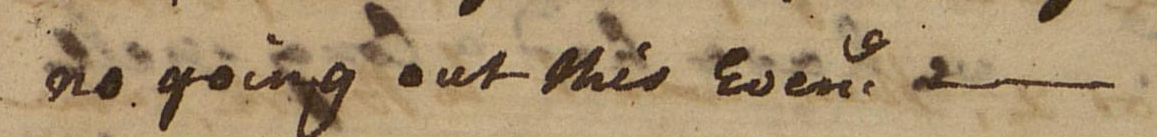no going out this Even^g. -
